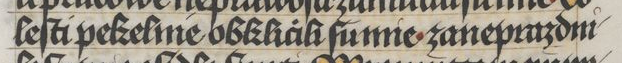leſti pekelné obkliċili ſu mie.zaneprazdni¬
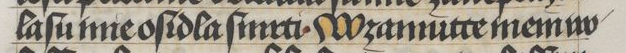laſu mie oſidla ſmrti.Wzamutce mem wo¬
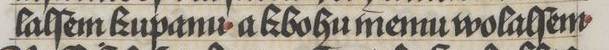lalſem kupanu.a kbohu memu wolalſem.
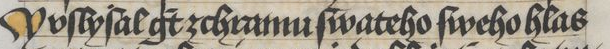Y uſlyẛal ḡt zchramu ſwateho ſweho hlas
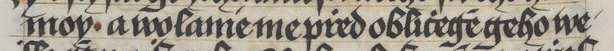moy.a wolanie me pṙed obliċegē geho we¬
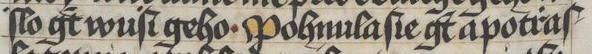ſlo ḡt wuẛi geho.Pohnula ſie ḡt a potṙaſ¬
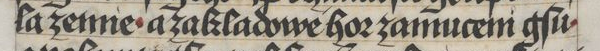la zemie.a zakladowé hor zamuceni gſu.
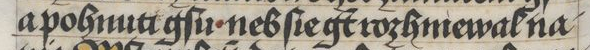a pohnuti gſu.neb ſie ḡt rozhniewal na¬
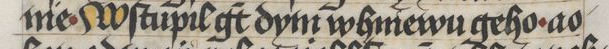nie.Wſtupil ḡt dym whniewu geho.a o¬
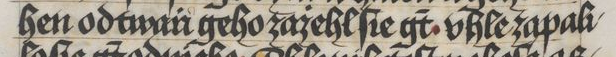hen od twaṙi geho zażehl ſie ḡt. uhle zapali¬
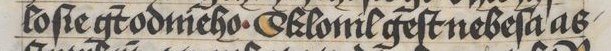lo ſie ḡt odnieho.Zklonil geſt nebeſa a s¬
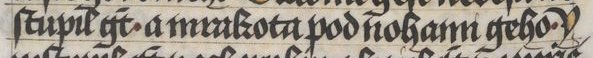ſtupil ḡt.a mrakota pod nohami geho.Y¬
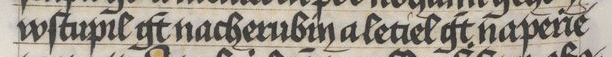wſtupil ḡt na cherubin a letiel ḡt napeṙíe
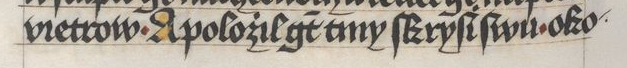vietrow.A položil ḡt tmy ſkryẛi ſwu.oko¬
